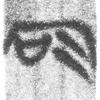含（今）
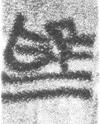爲
